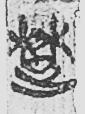楚
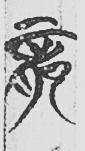龍
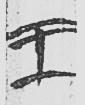王
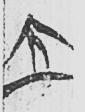立
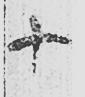七
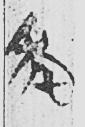年
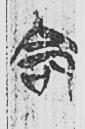命
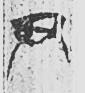尹
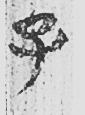子
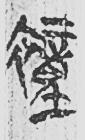{衣童}
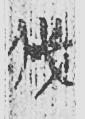伐
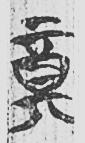奠
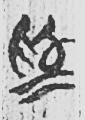爲
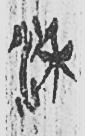{水禾}
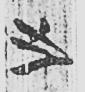之
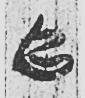𠂤
